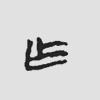乍
